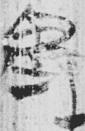畏（危）
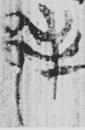邦
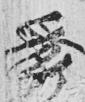家
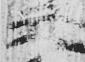亓
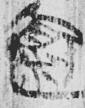褱（壞）
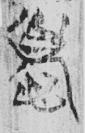憂
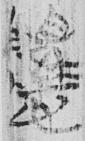懼
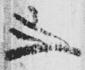之
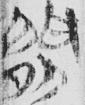○（閒）
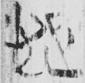○（疏）
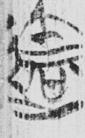達
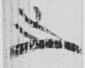之
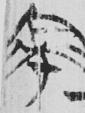○（次）
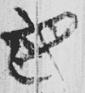母
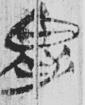{胃刀}（謂）
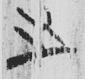之
